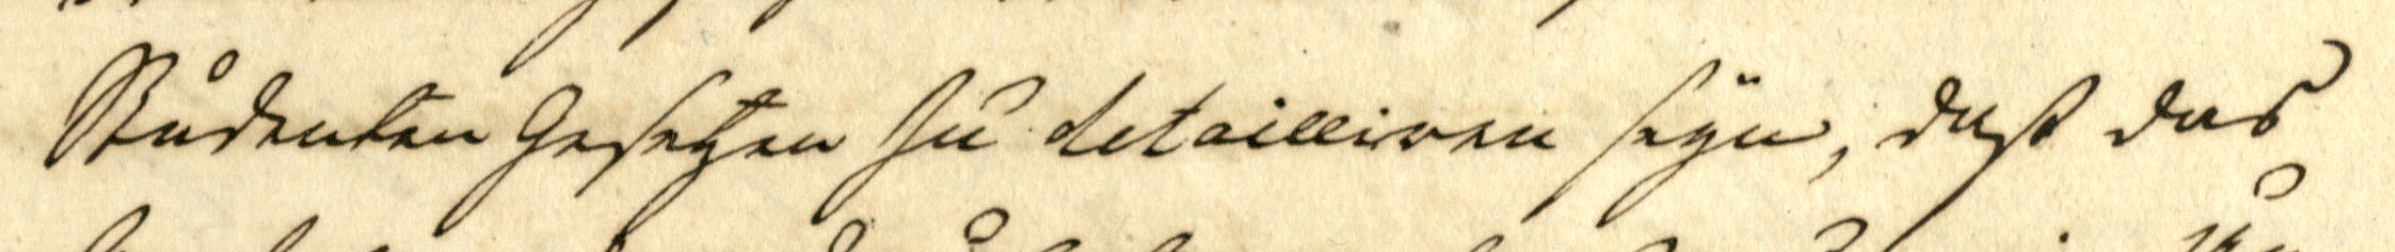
Studenten Gesetzen zu detailliren seÿn, daß das
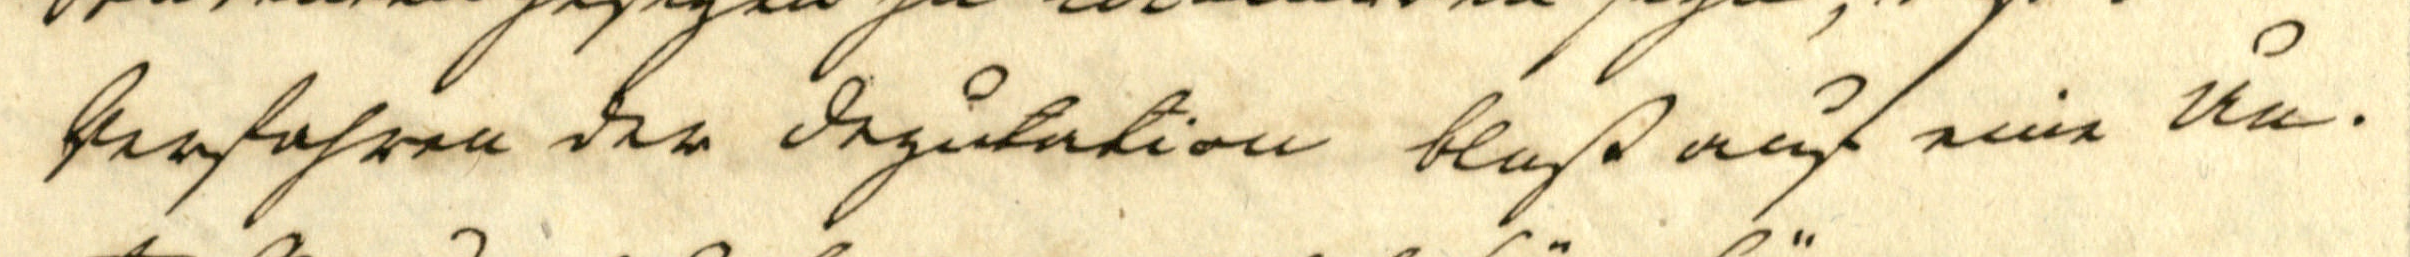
Verfahren der Deputation bloß auf eine Un¬
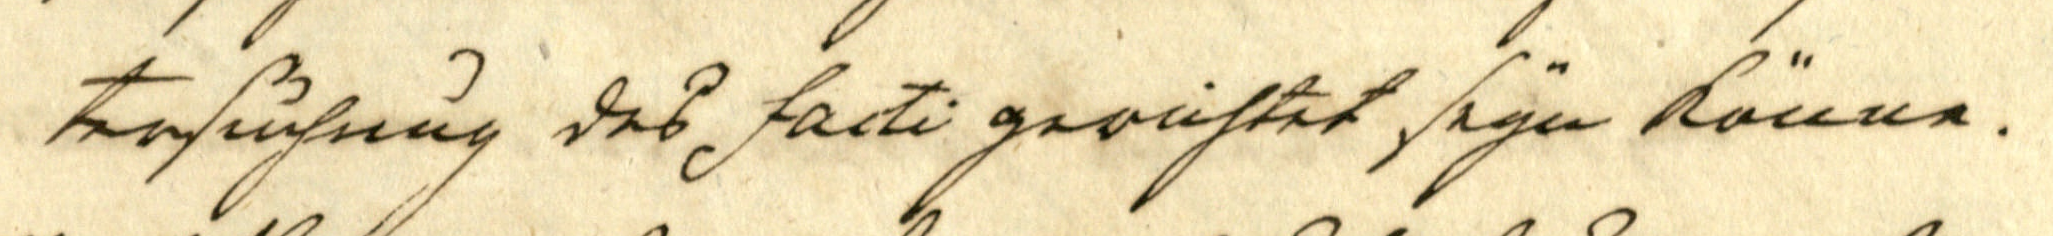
tersuchung des Facti gerichtet seÿn könne.
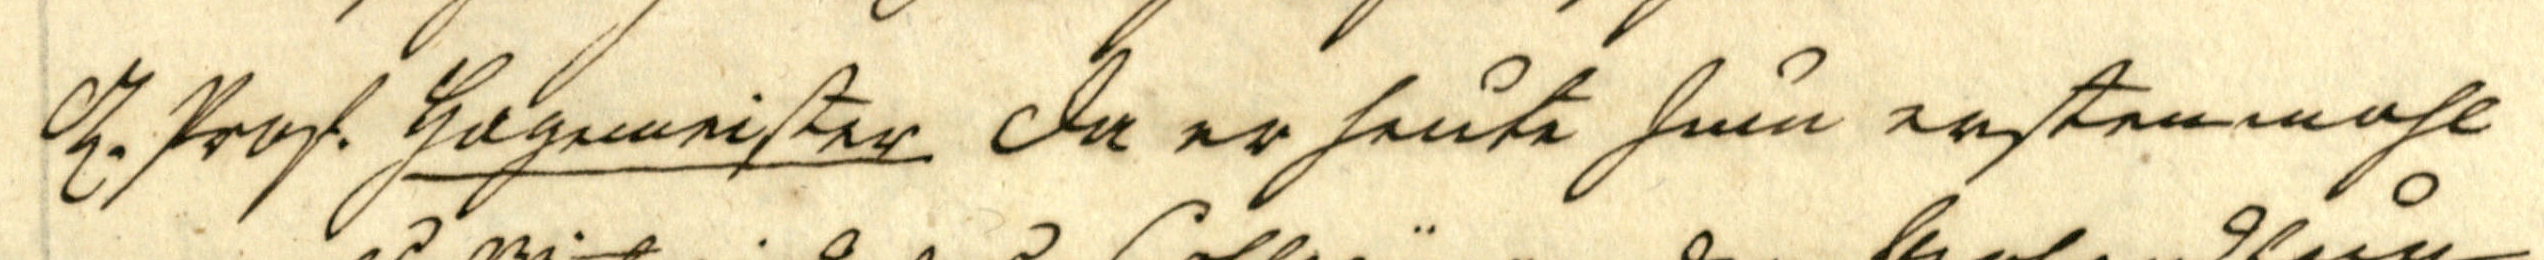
dh. Prof. Hagemeister. Da er heute zum erstenmahl
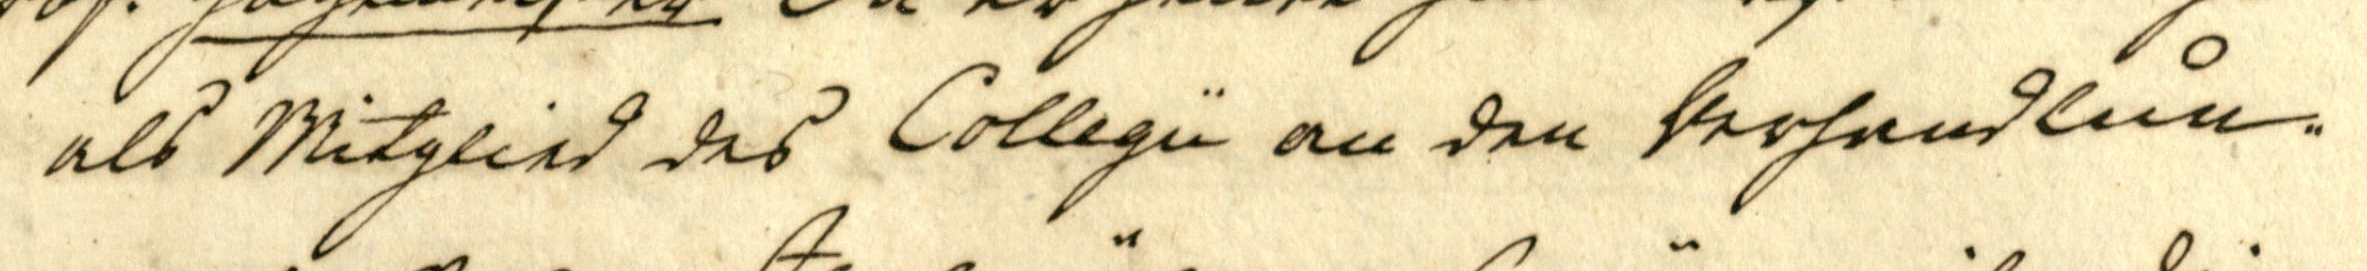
als Mitglied des Collegii an den Verhandlun¬
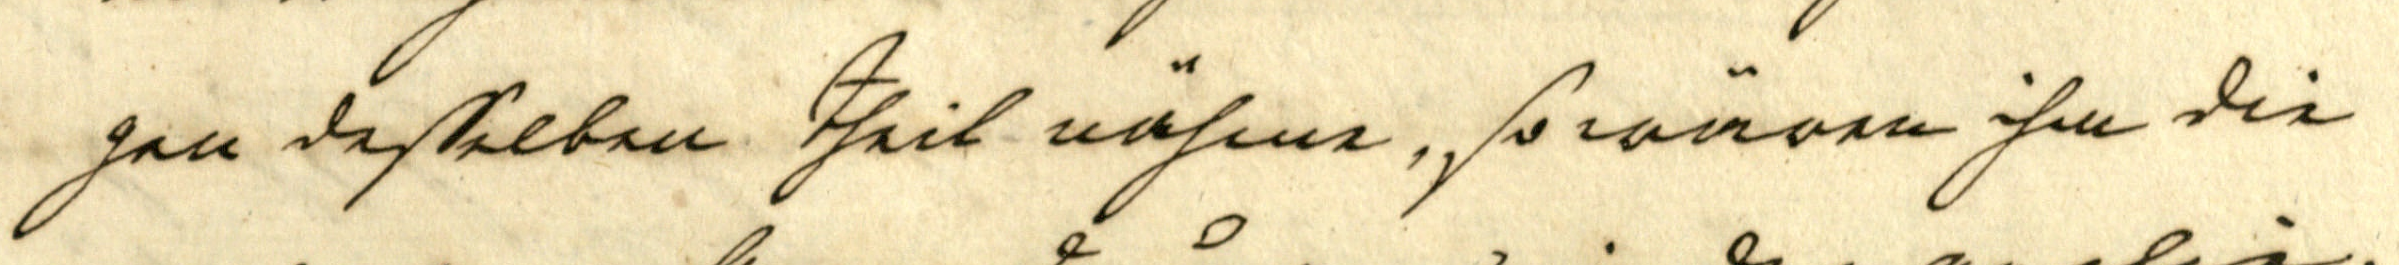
gen desselben Theil nähme, so wären ihm die
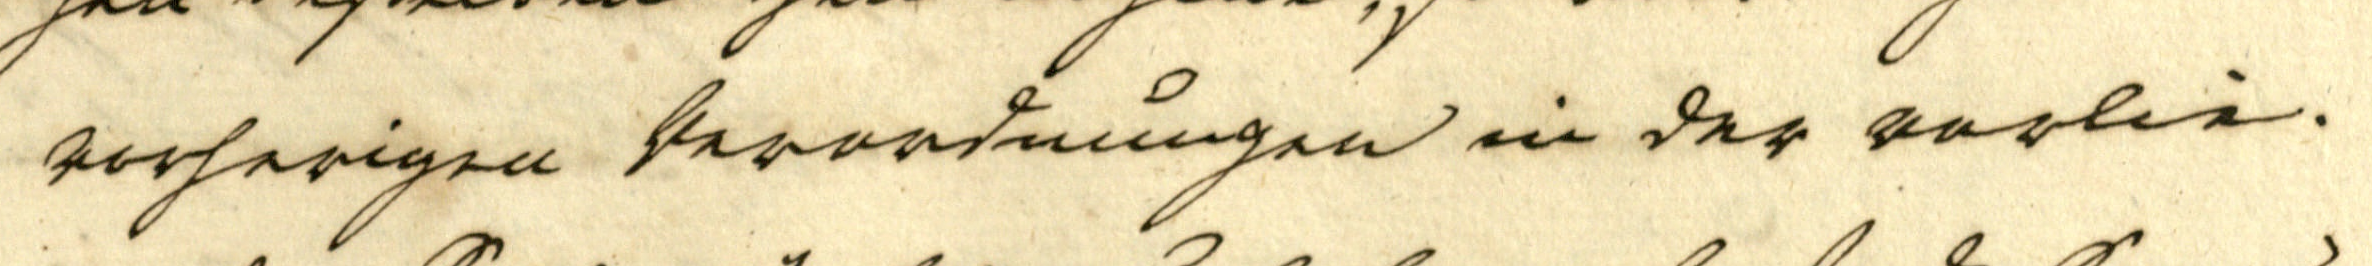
vorherigen Verordnungen in der vorlie¬
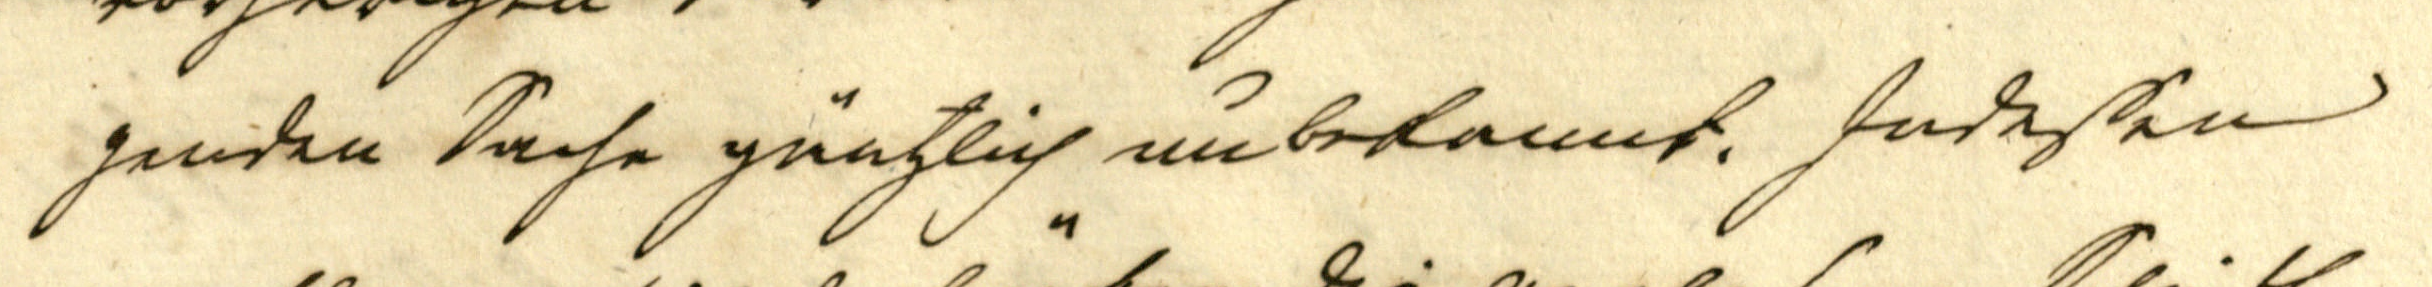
jenden Sache gäntzlich unbekannt. Indessen
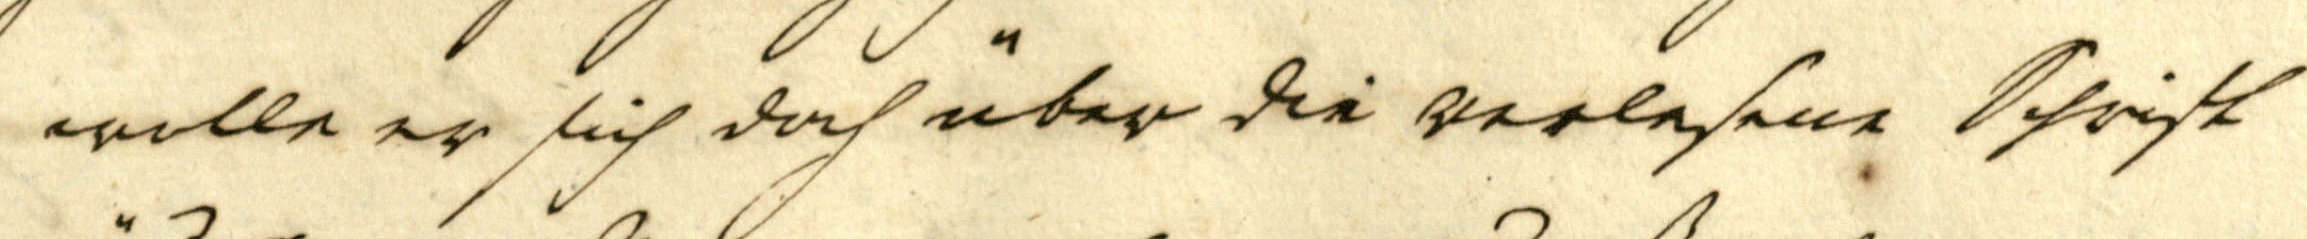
wolle er sich doch über die verlesene Schrift
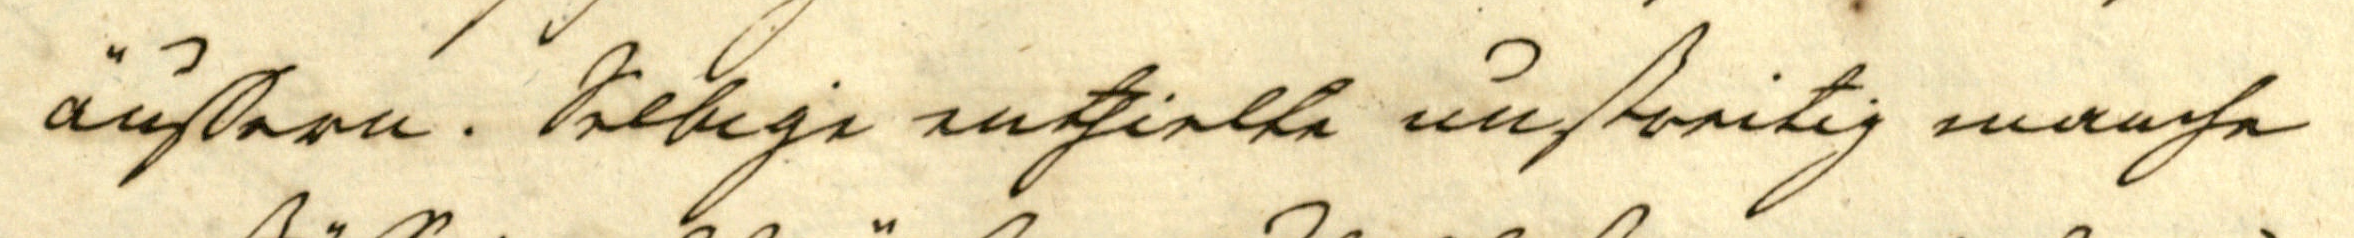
äussern. Selbige enthielte unstreitig manche
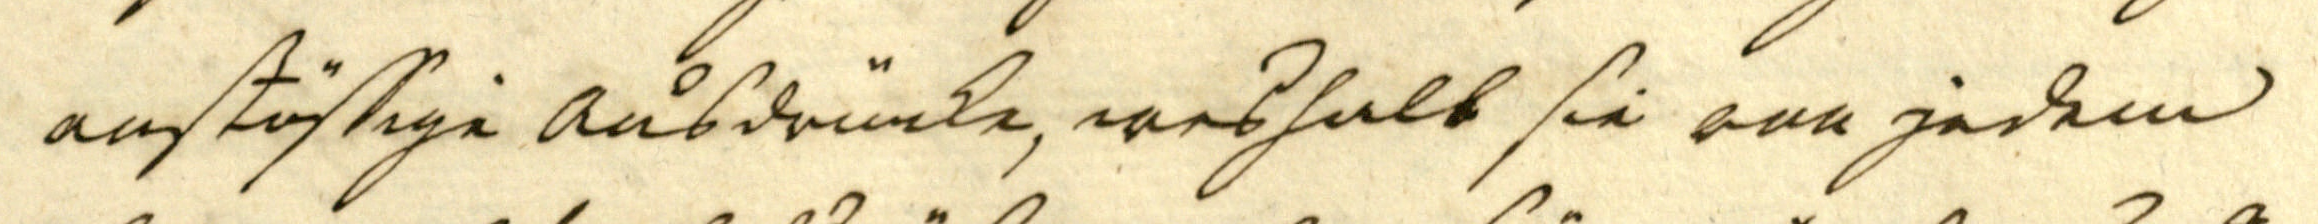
anstössige Ausdrücke, weshalb sie von jedem
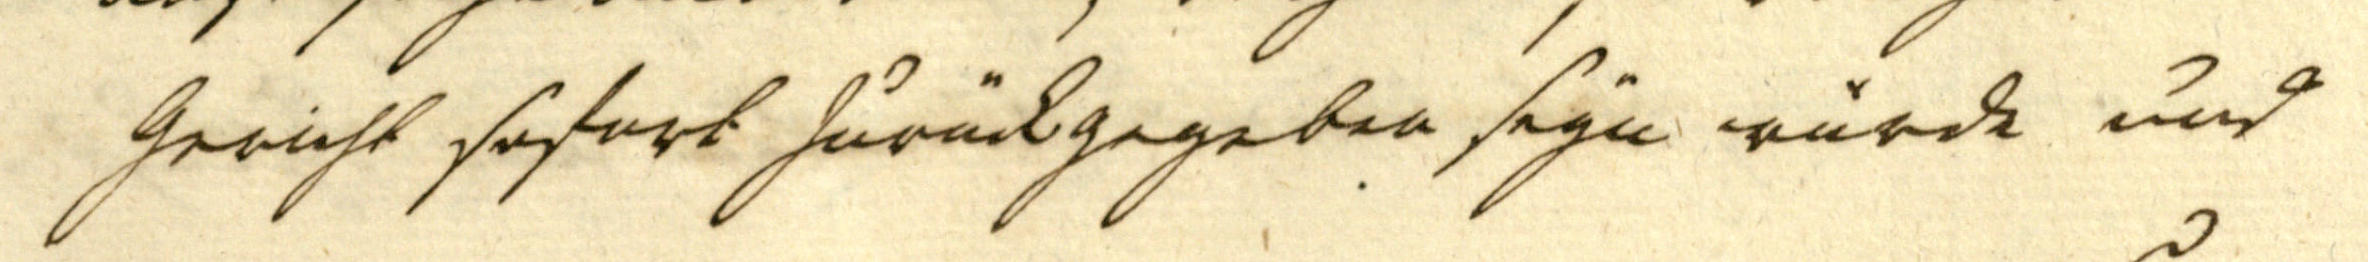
Gericht sofort zurückgegeben seÿn würde und
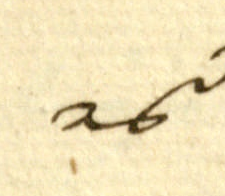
es
